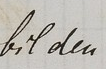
Werthe
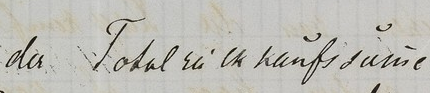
der Totalrückkaufssumme
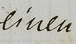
bilden.
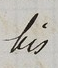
B.
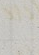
der
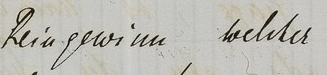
Reingewinn welcher
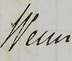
Jahre
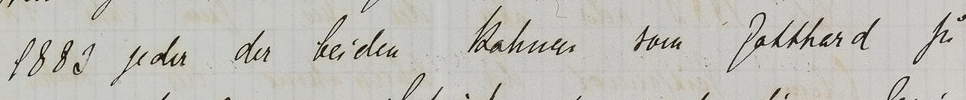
1883 jeder der beiden Bahnen vom Gotthard zu-
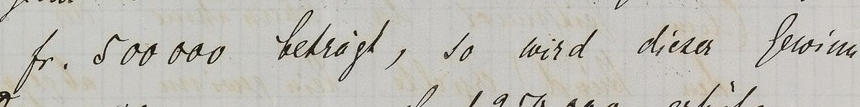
Fr. 500 000 beträgt, so wird dieser Gewinn
